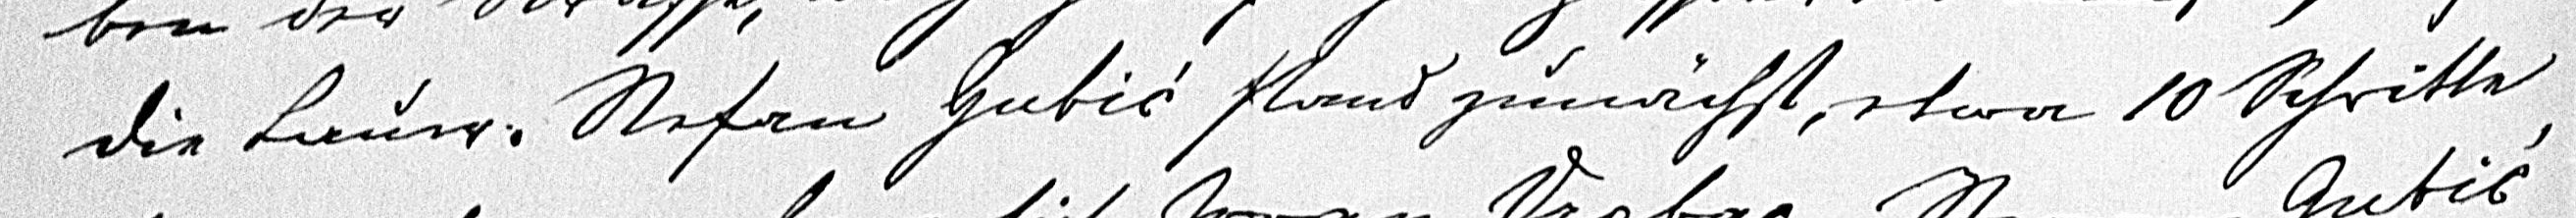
die Lauer. Stefan Gubić stand zunächst, etwa 10 Schritte
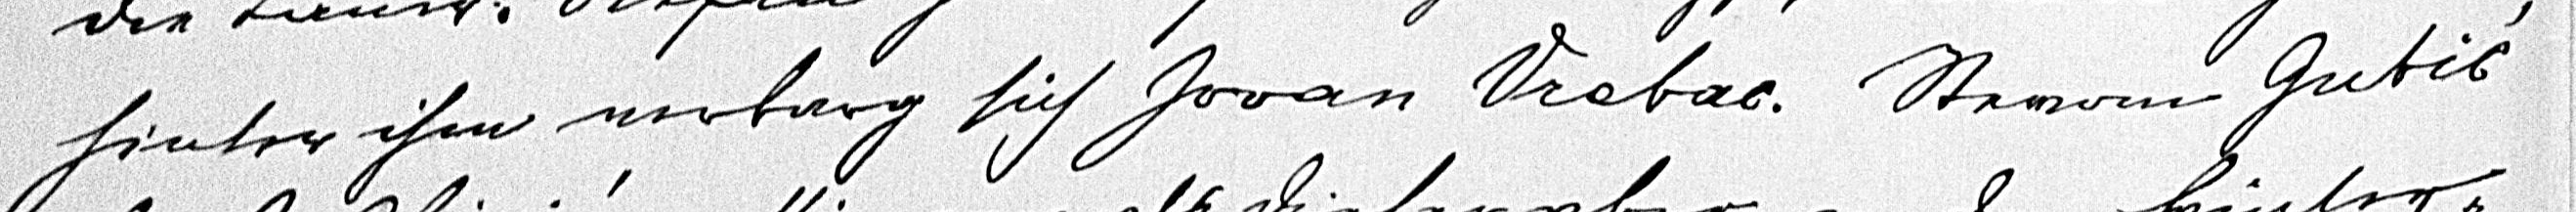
hinter ihm verbarg sich Jovan Vrebac. Stevan Gubić
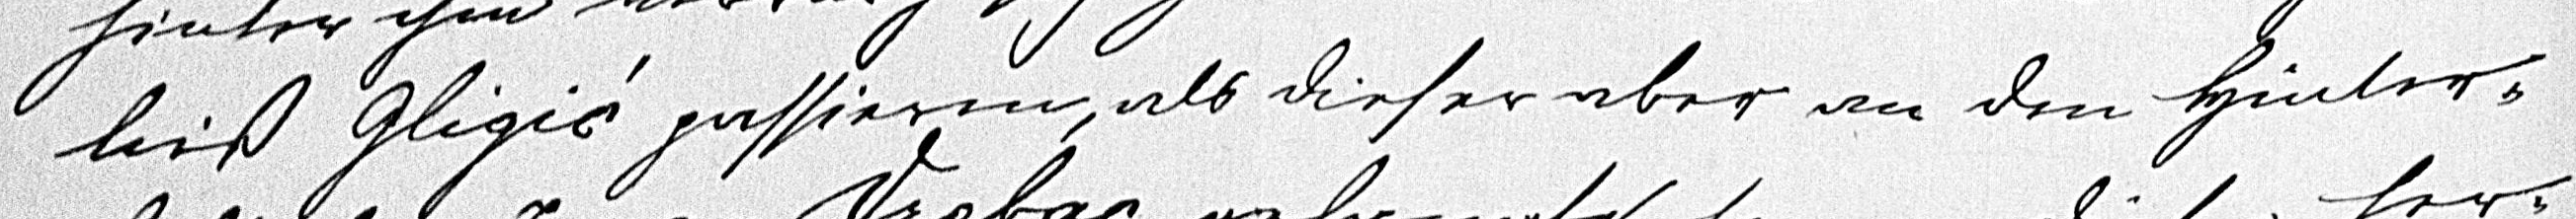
ließ Gligić passieren, als dieser aber an den Hinter¬
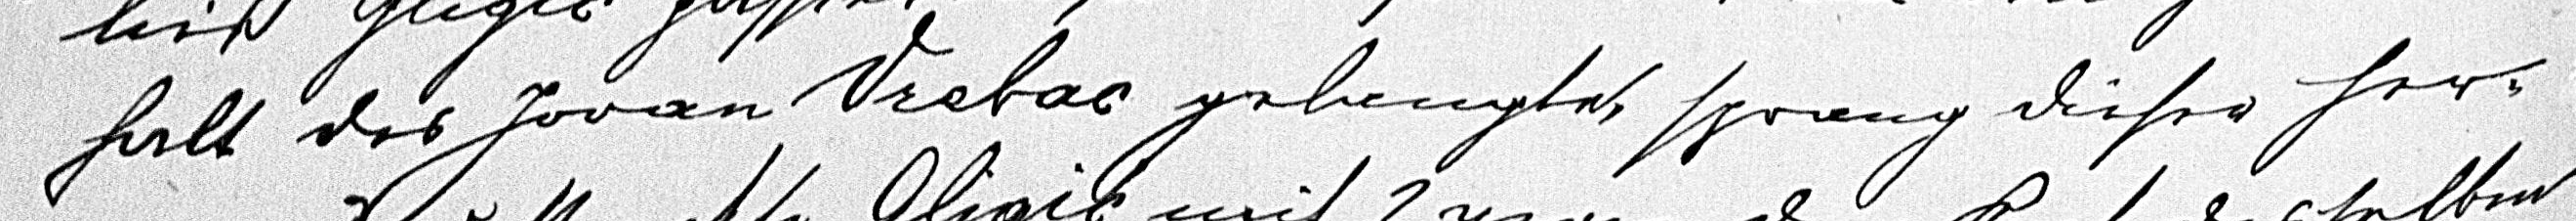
halt des Jovan Vrebac gelangte, sprang dieser her¬
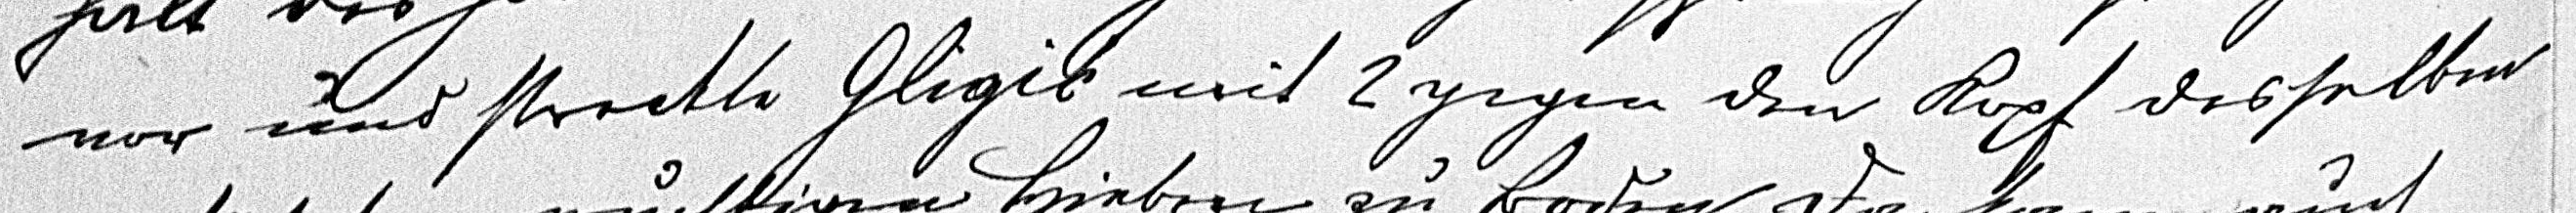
vor und streckte Gligić mit 2 gegen den Kopf desselben
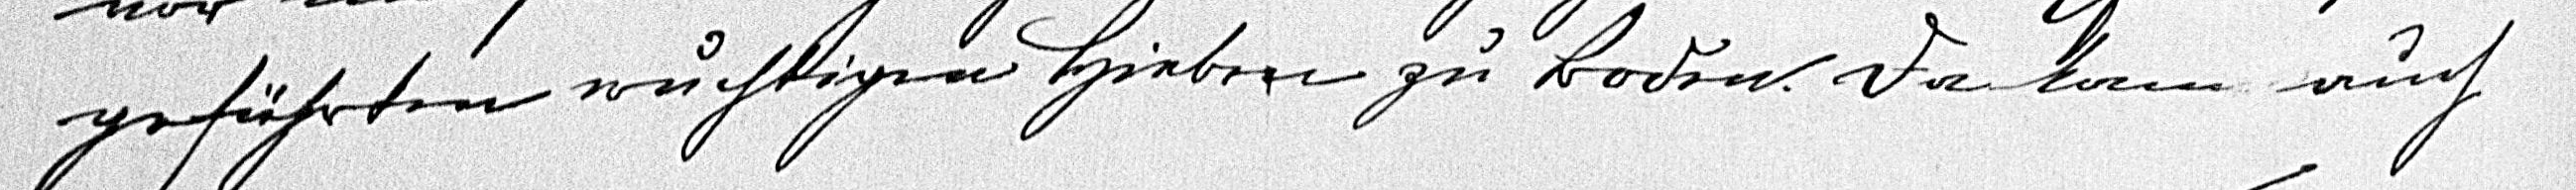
geführten wuchtigen Hieben zu Boden. Da kann auch
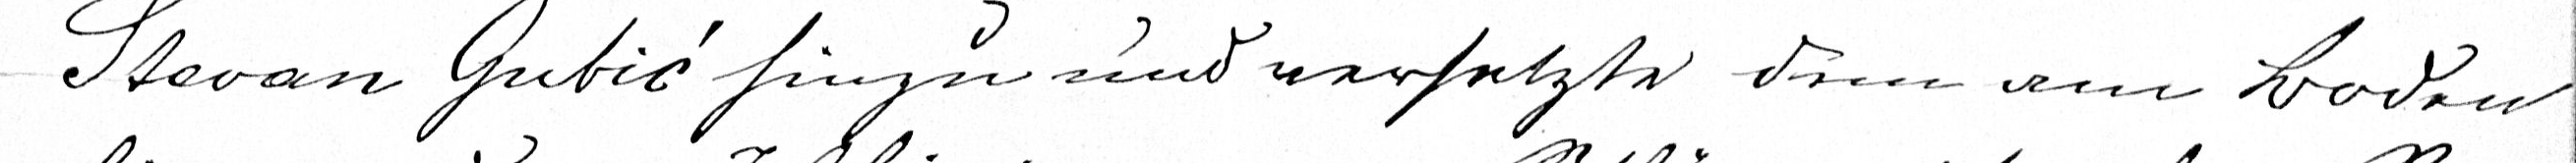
Stevan Gubić hinzu und versetzte dem am Boden
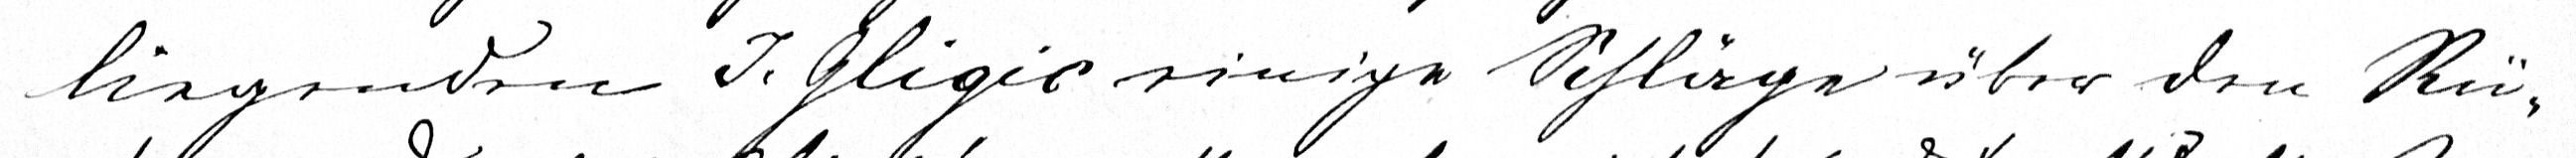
liegenden J. Gligic einige Schläge über den Rü¬
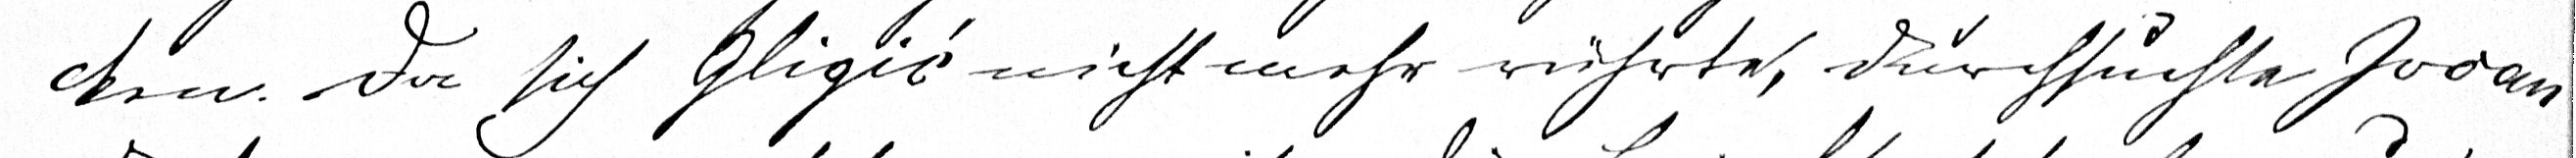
cken. Da sich Gligić nicht mehr rührte, durchsuchte Jovan
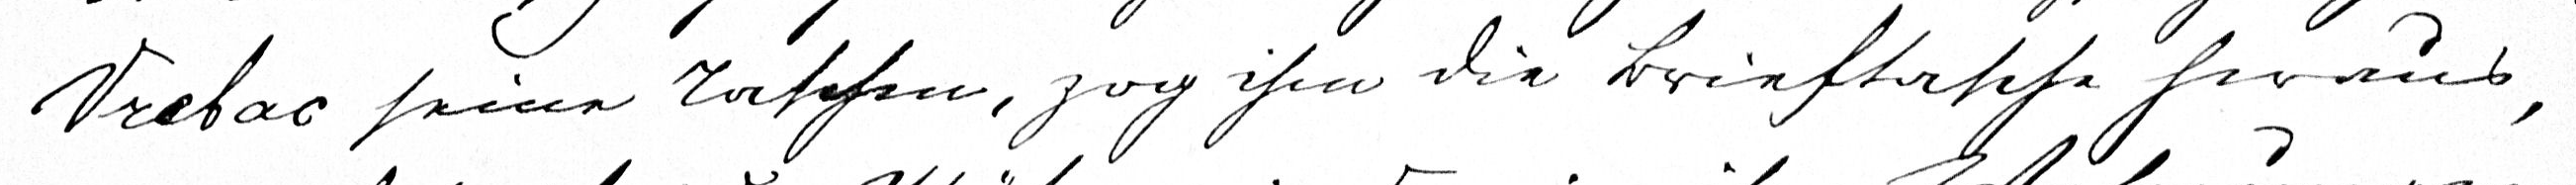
Vrebac seine Taschen, zog ihm die Brieftasche heraus,
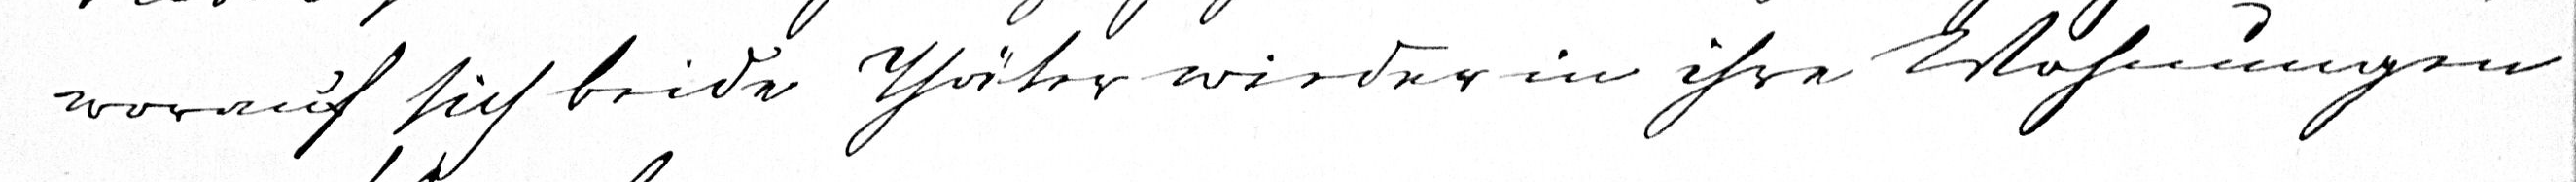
worauf sich beide Thäter wieder in ihre Wohnungen
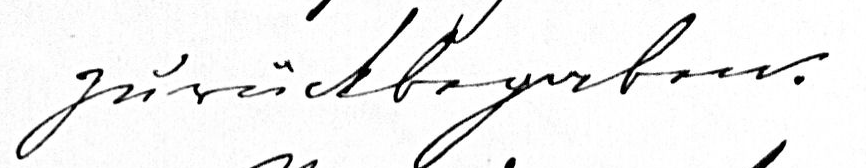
zurückbegaben.
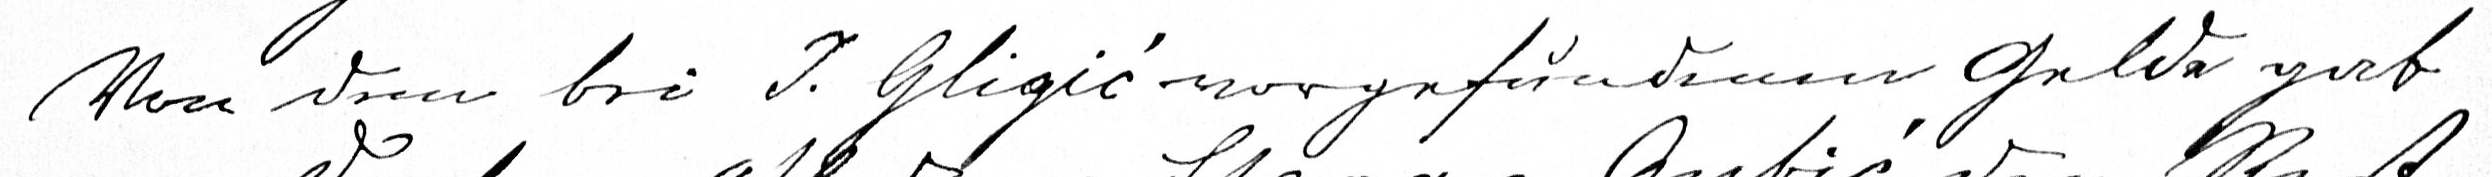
Von dem bei J. Gligić vorgefundenen Gelde gab
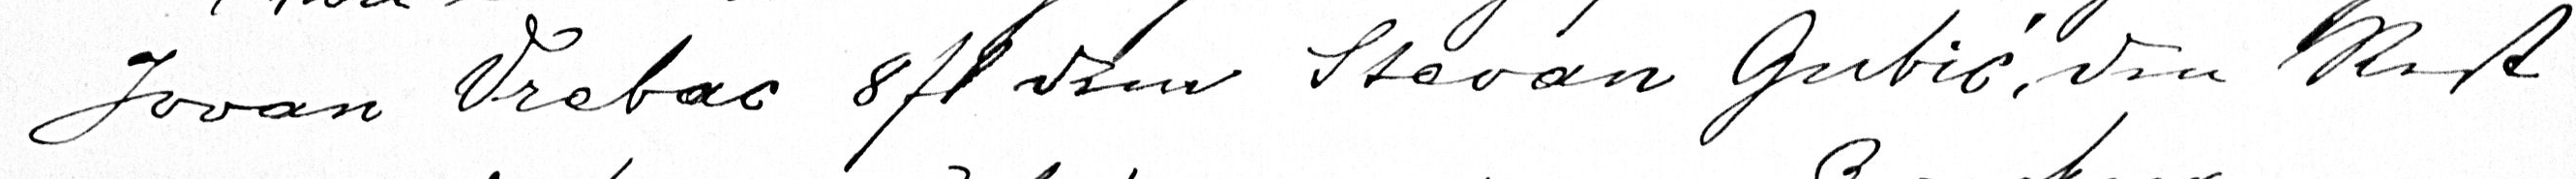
Jovan Vrebac 8fl dem Stevan Gubić, den Rest
